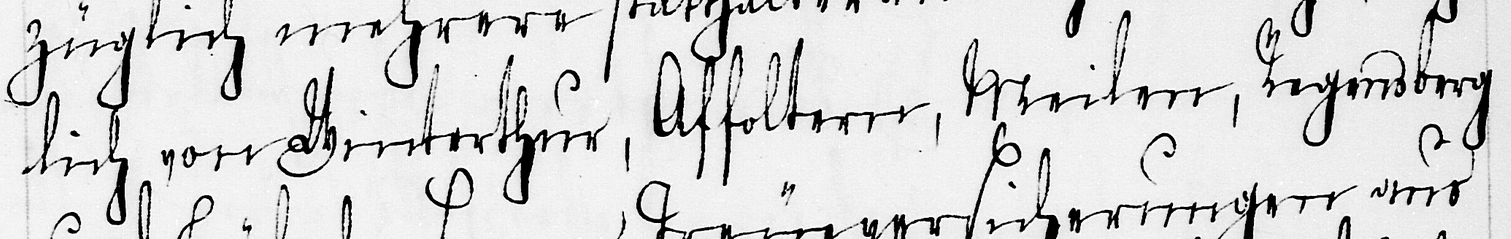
lich von Winterthur, Affoltern, Meilen, Regensberg
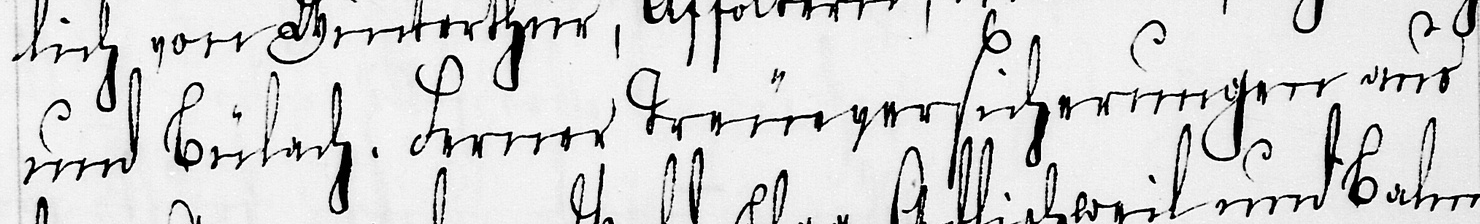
und Bülach. Ferner Treueversicherungen aus
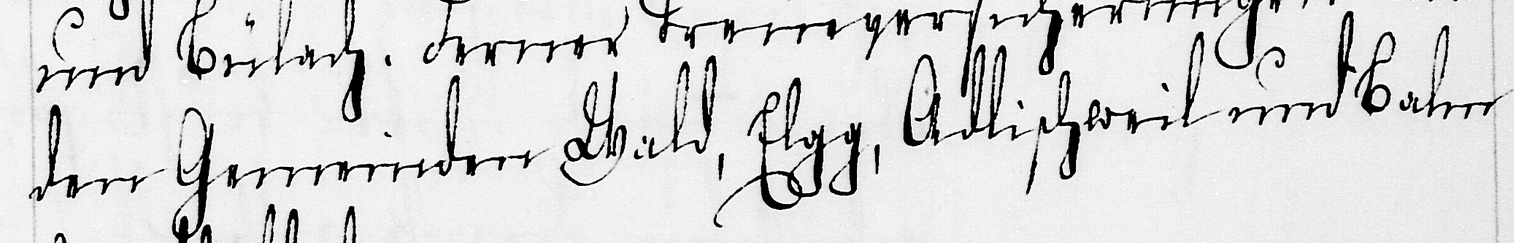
den Gemeinden Wald, Elgg, Adlischweil und Balm
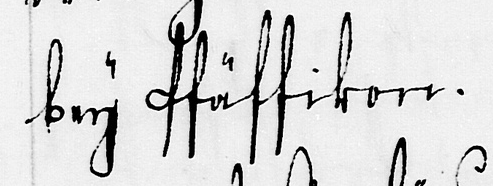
bey Pfäffikon.
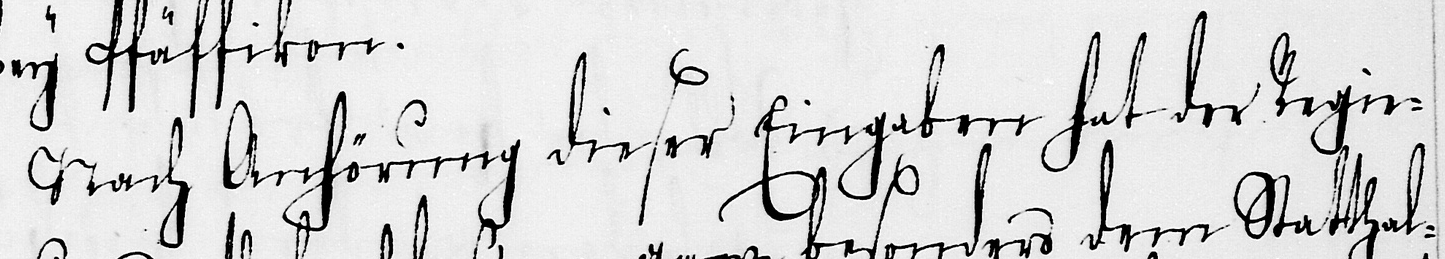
Nach Anhörung dieser Eingaben hat der Regie¬
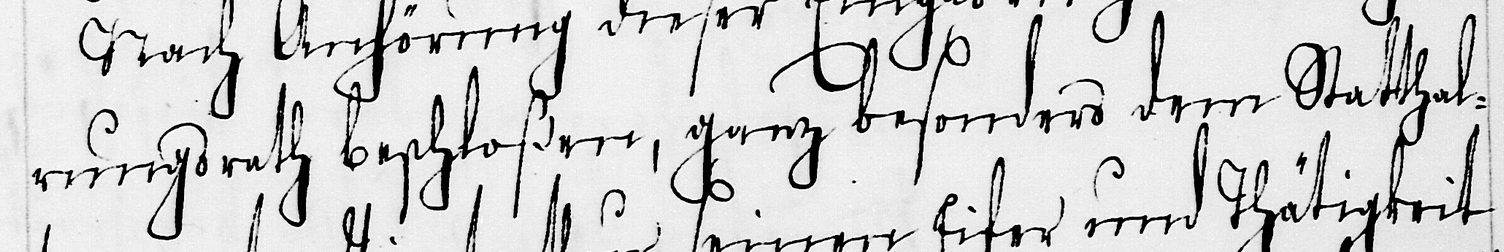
rungsrath beschloßen, ganz besonders dem Statthal¬
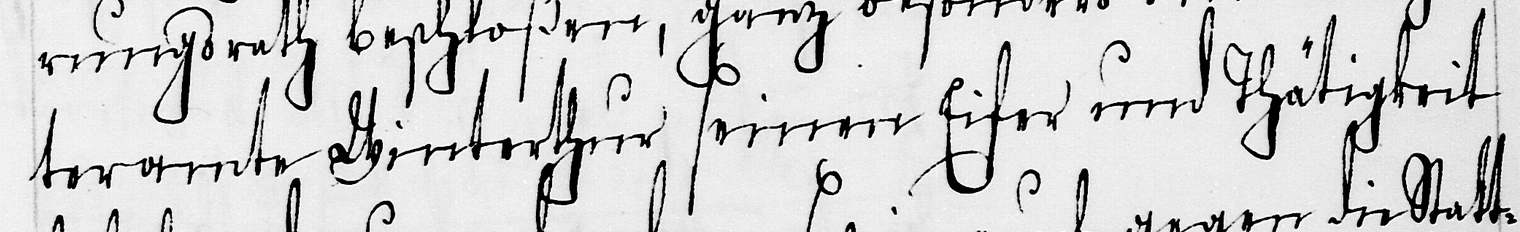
teramte Winterthur seinen Eifer und Thätigkeit
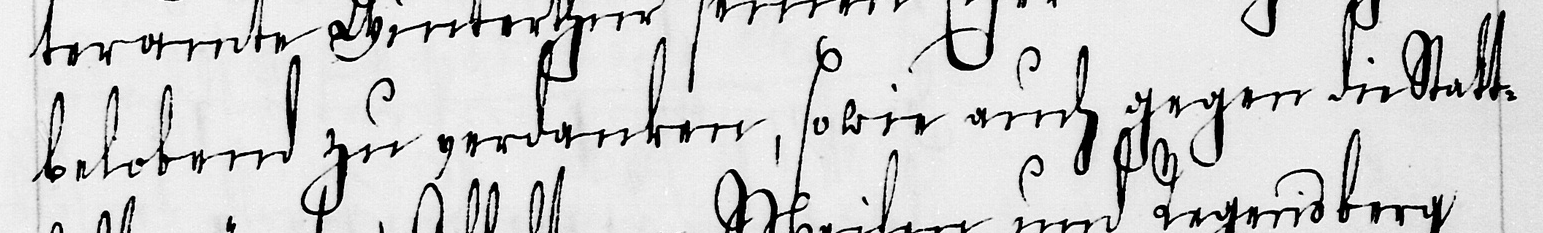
belobend zu verdanken, sowie auch gegen die Stat¬
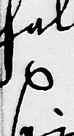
s¬
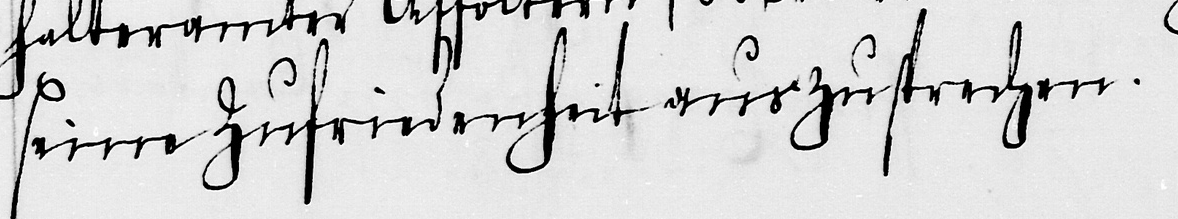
eine Zufriedenheit auszusprechen.
